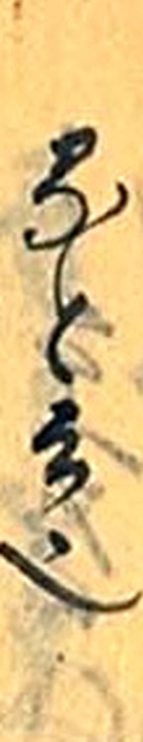ると云也
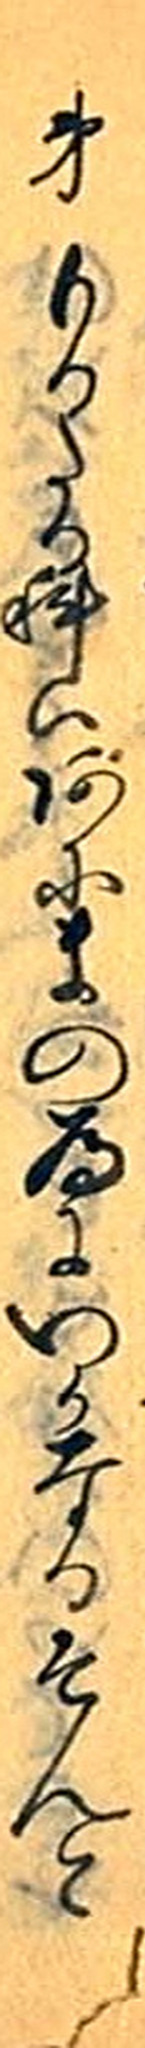弟もるたる科はあにまの為にいかなるそんと
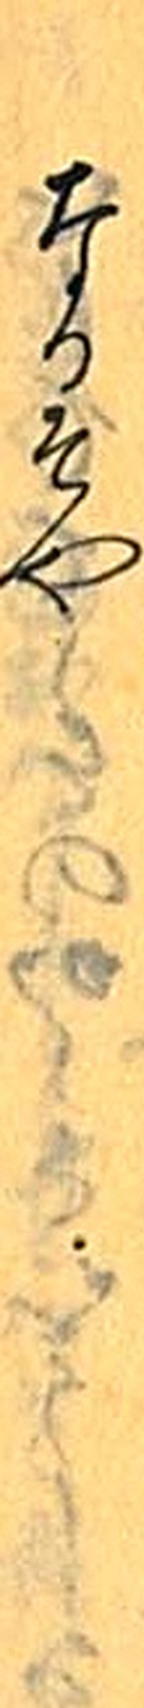なるそや
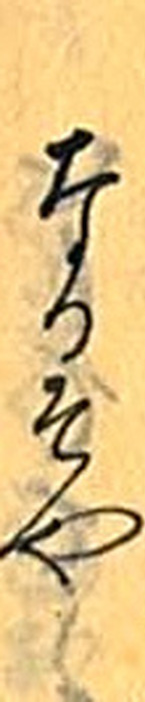なるそや
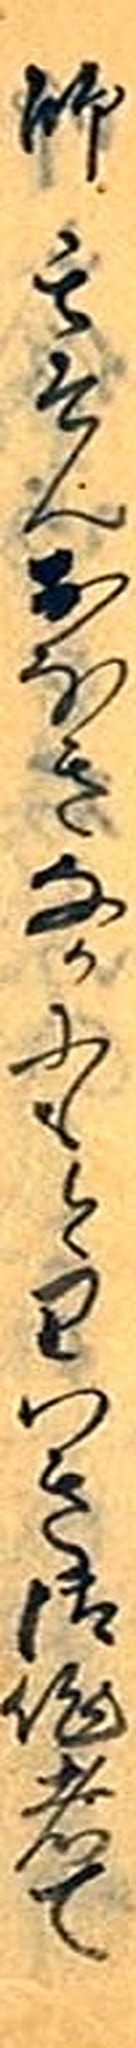師其そんおほきなかにもとりはき御作者て
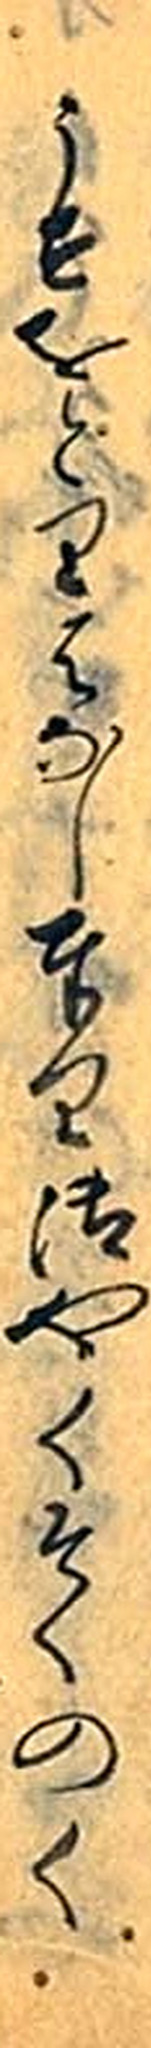うすをとりはなし奉り御やくそくのく
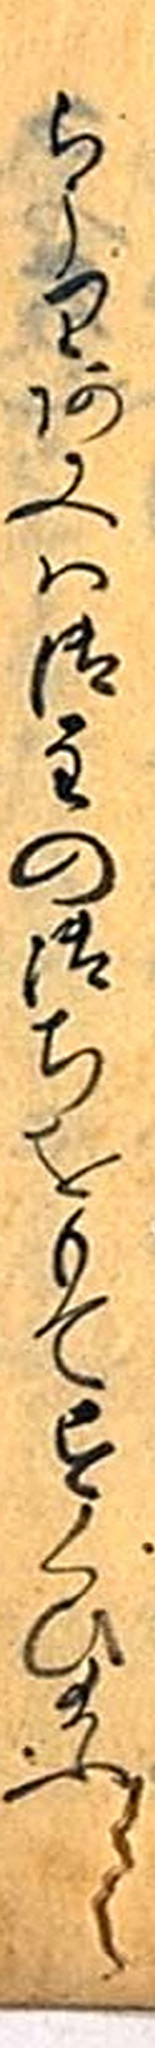らうりあ又は御主の御ちをもてすくひ給ふ
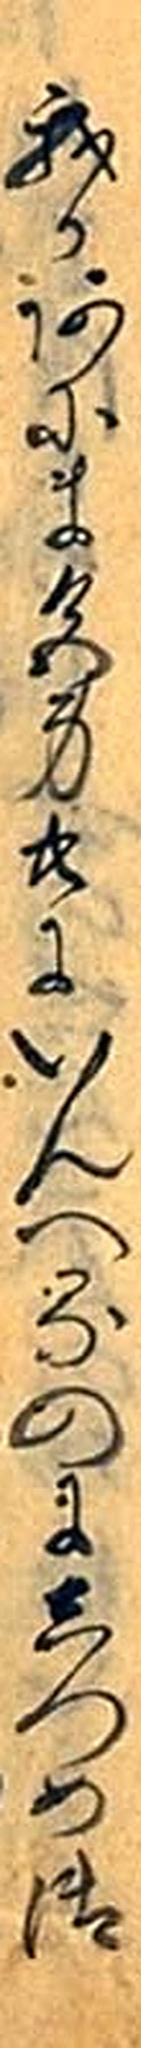我かあにま色身共にいんへるのにしつめ御
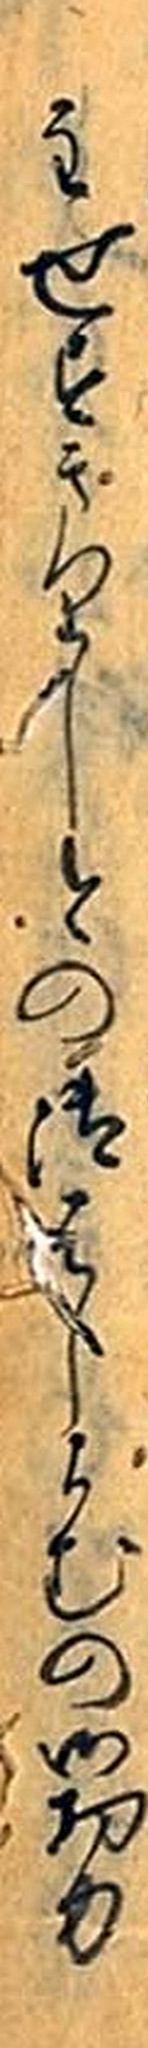主せすきりしとの御はしよむの御功力

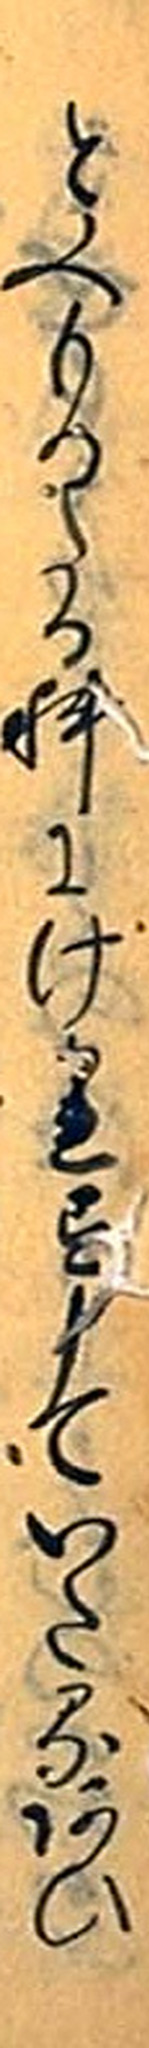と又もるたる科にけかれすしていたるあひ
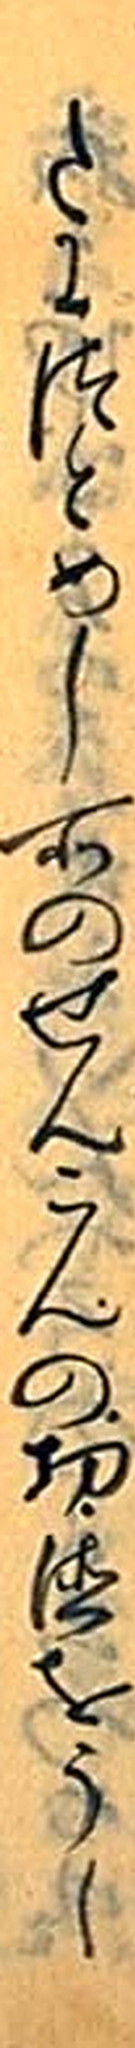たにつとめし所のせんこんの功徳をうし
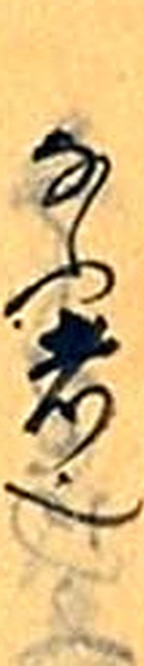なふ者也
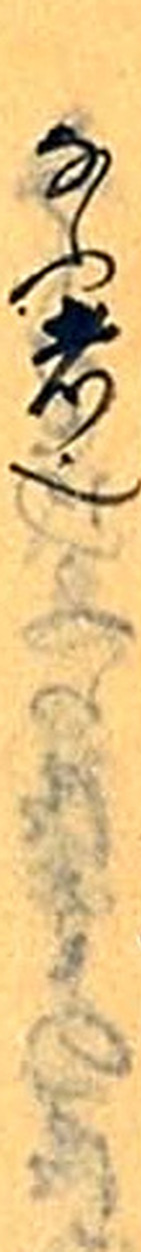なふ者也
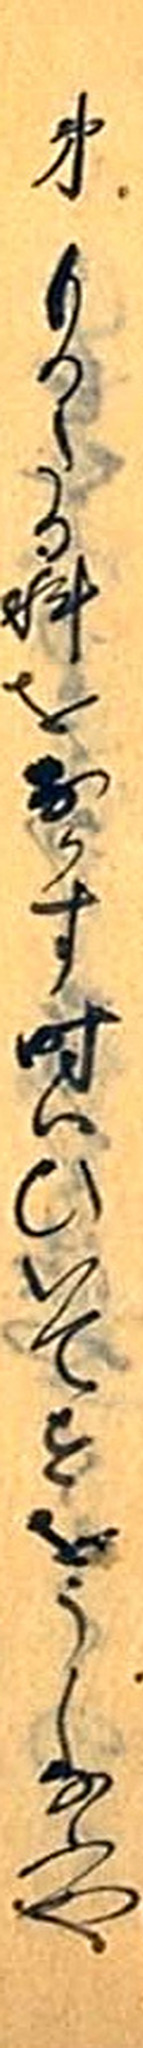弟もるたる科をおかす時はひいてすをうしなふや
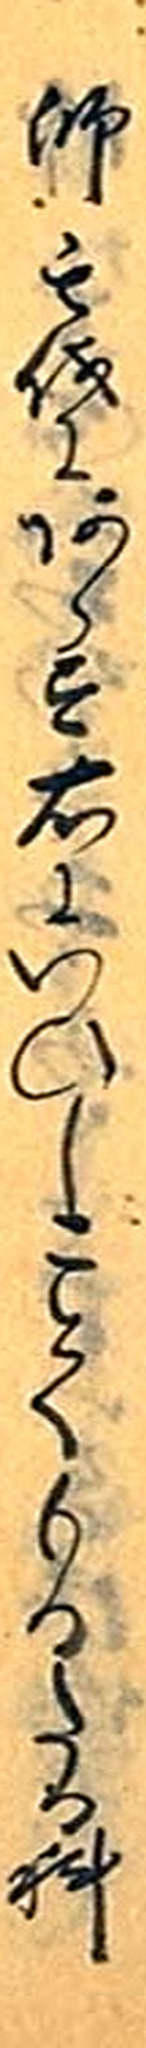師其儀にあらす右にいひしことくもるたる科
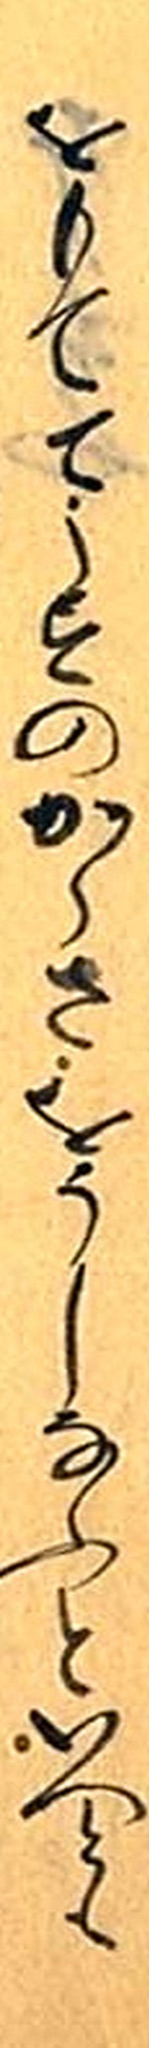をもててうすのからさをうしなふといへとも
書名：ドチリナ・キリシタン
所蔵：東京大学総合図書館 / General Library in the University of Tokyo
